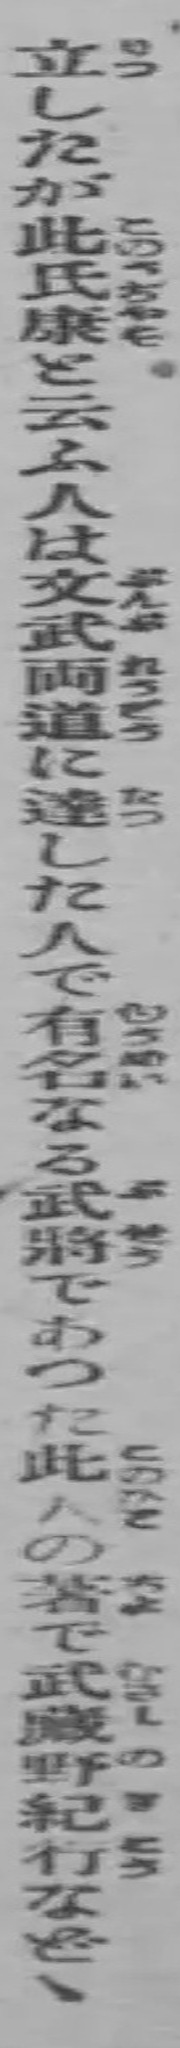立したが此氏康と云ふ人は文武両道に達した人で有名なる武将であつた此人の著で武蔵野紀行などゝ
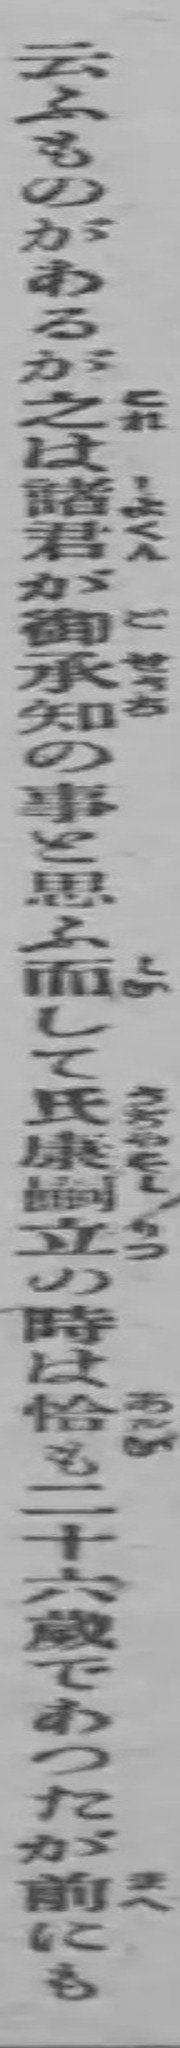云ふものがあるが之は諸君が御承知の事と思ふ而して氏康嗣立の時は恰も二十六歳であつたが前にも
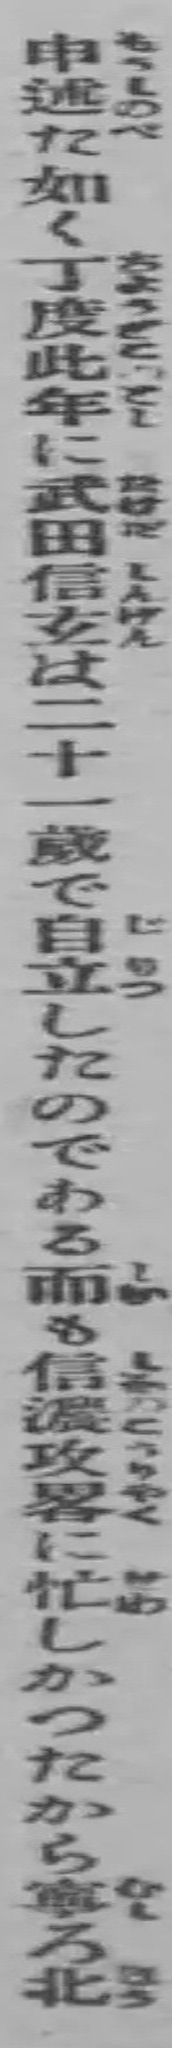申述た如く丁度此年に武田信玄は二十一歳で自立したのである而も信濃攻略忙しかつたから寧ろ北
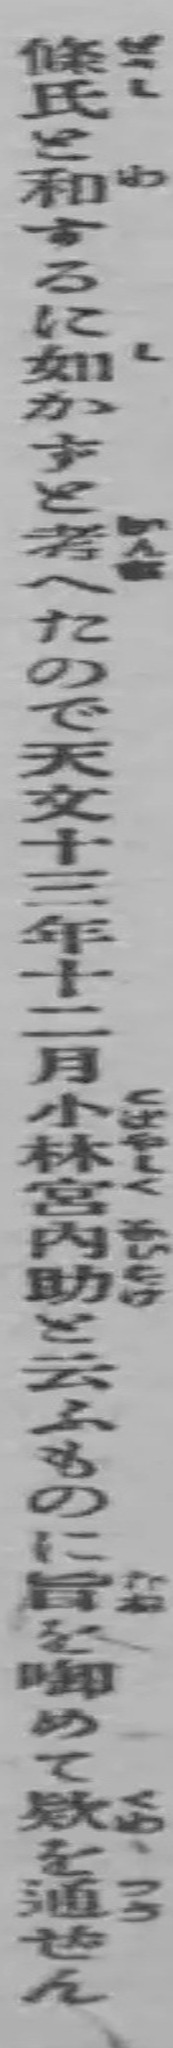条氏と和するに如かずと考へたので天文十三年十二月小林宮内助と云ふものに旨を啣めて欵を通ぜん
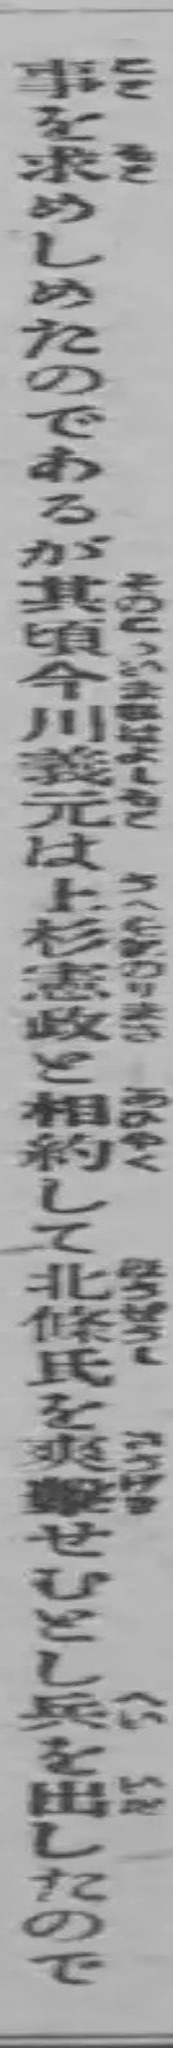事を求めしめたのであるが其頃今川義元は上杉憲政と相約して北条氏を爽撃せむとし兵を出したので
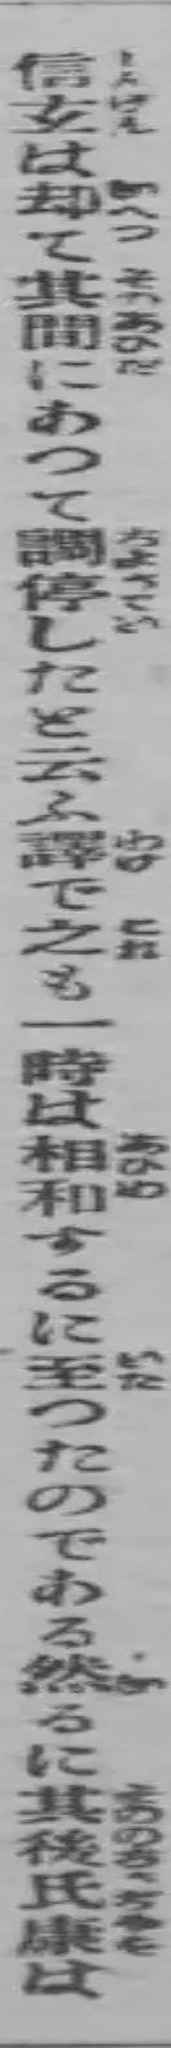信玄は却て其間にあつて調停したと云ふ訳で之も一時は相和するに至つたのである然るに其後氏康は
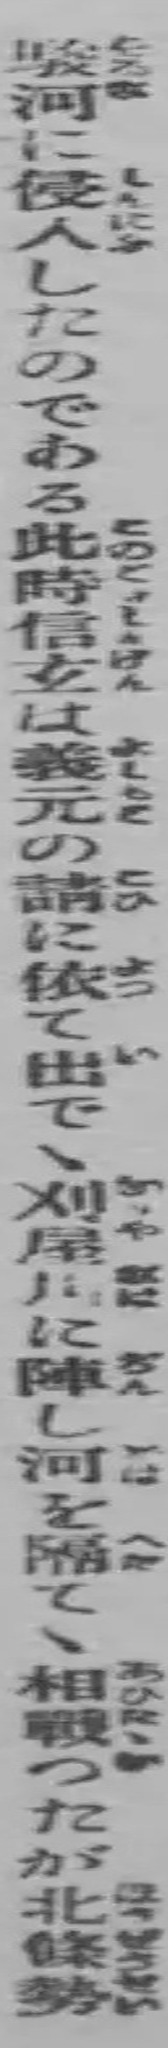駿河に侵入したのである此時信玄は義元の請に依て出でゝ刈屋川に陣し河を隔てゝ相戦つたが北条勢
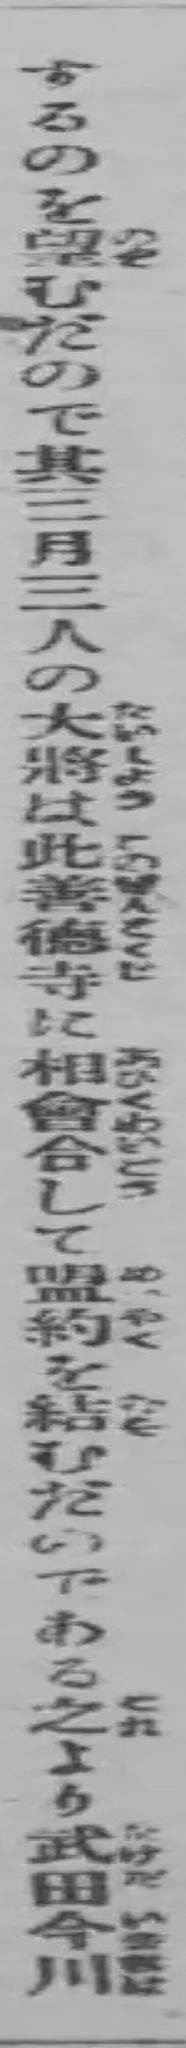盟するのを望むだので其三月三人の大将は此善徳寺に相会合して盟約を結むだのである之より武田今川
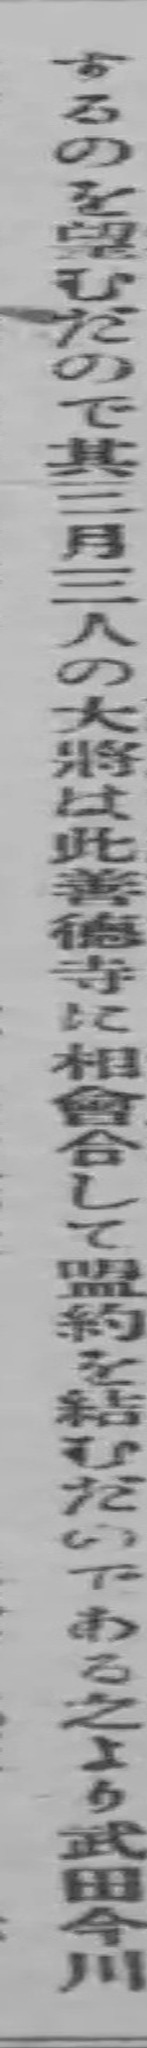盟するのを望むだので其三月三人の大将は此善徳寺に相会合して盟約を結むだのである之より武田今川
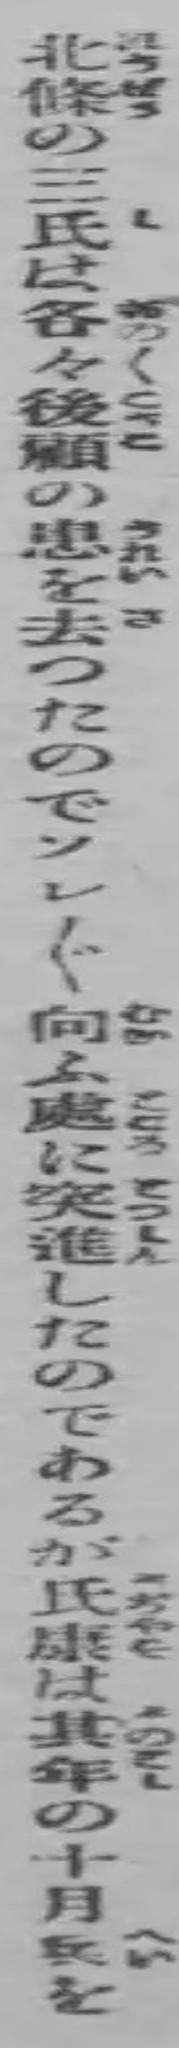北条の三氏は各々後顧の患を去つたのでソレ〴〵向ふ処に突進したのであるが氏康は其年の十月兵を
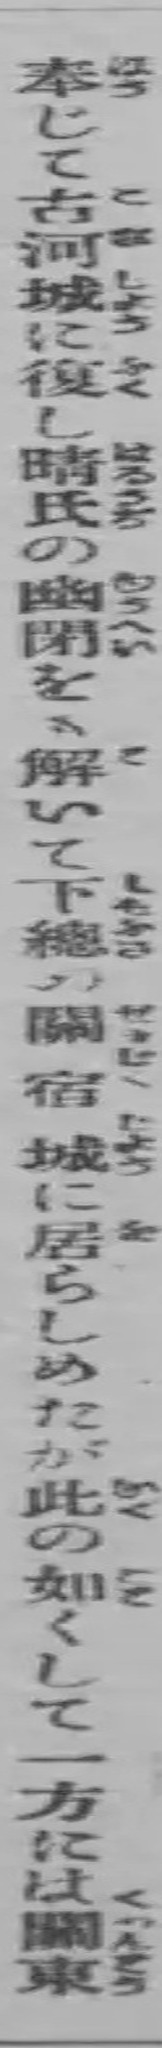奉じて古河城に復し晴氏の幽閉をも解いて下総の関宿城に居らしめたが此の如くして一方には関東
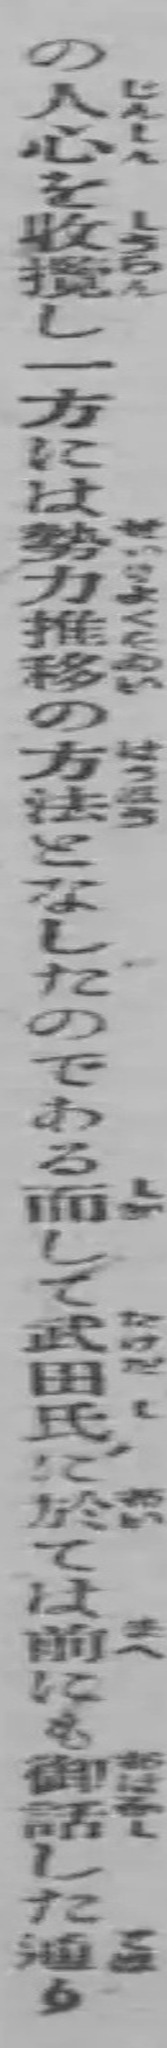の人心を収攬し一方には勢力推移の方法となしたのである而して武田氏に於ては前にも御話した通り
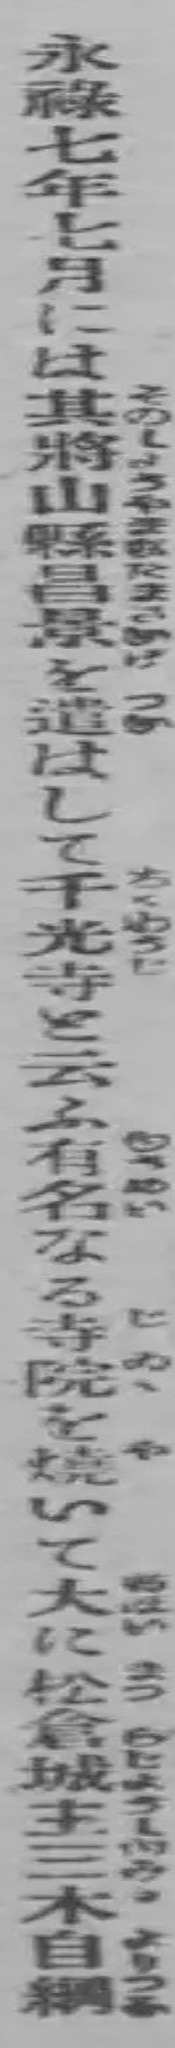永禄七年七月には其将山縣政昌景を遣はして千光寺と云ふ有名なる寺院を焼いて大に松倉城主三木自綱
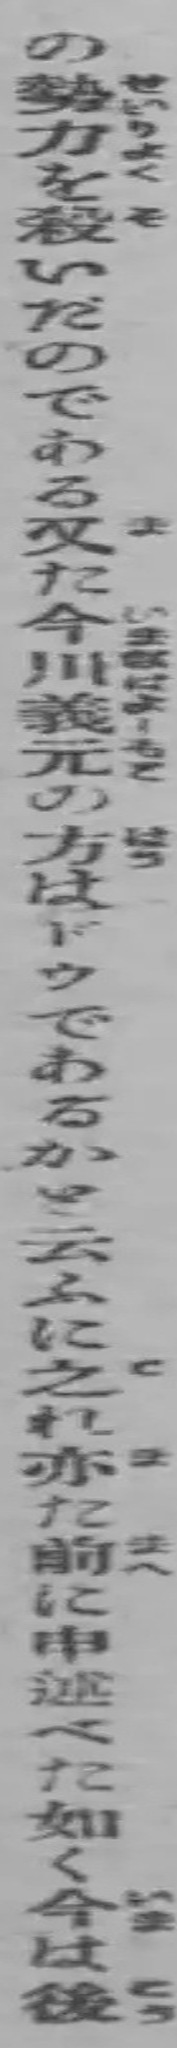の勢力を殺いだのである又た今川義元の方はドウであるかと云ふに之れ亦た前に申述べた如く今は後

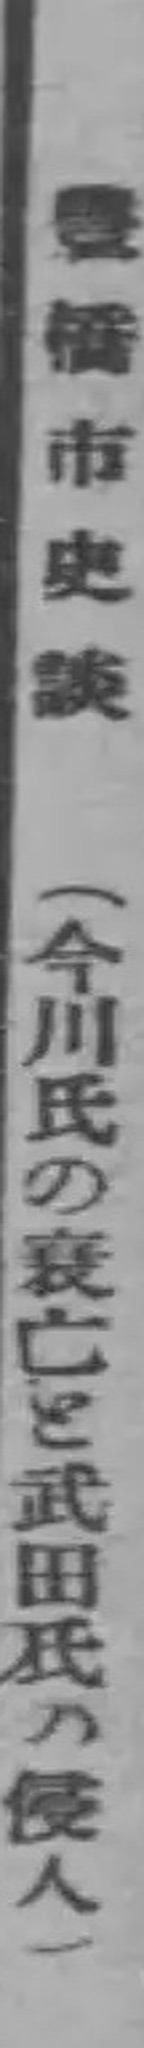豊橋市史談(今川氏の衰亡と武田氏の侵入)百二
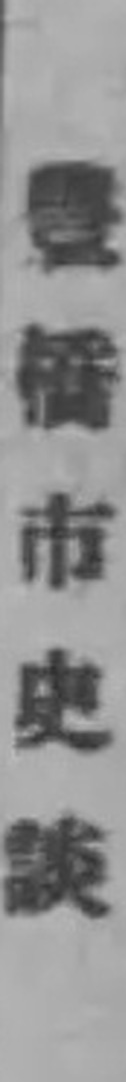豊橋市史談
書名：豊橋市史談
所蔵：国立国会図書館 National Diet Library, JAPAN
